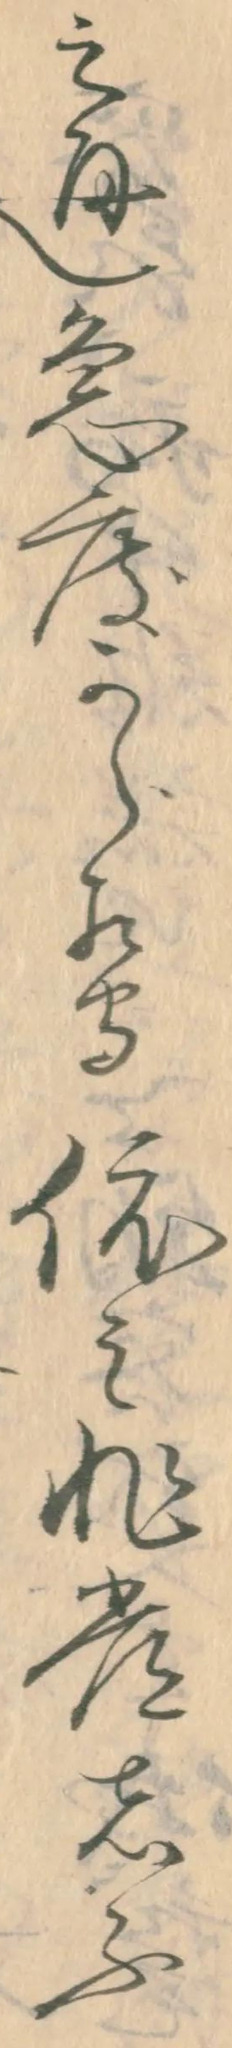之通急度可被相守依之非常者不
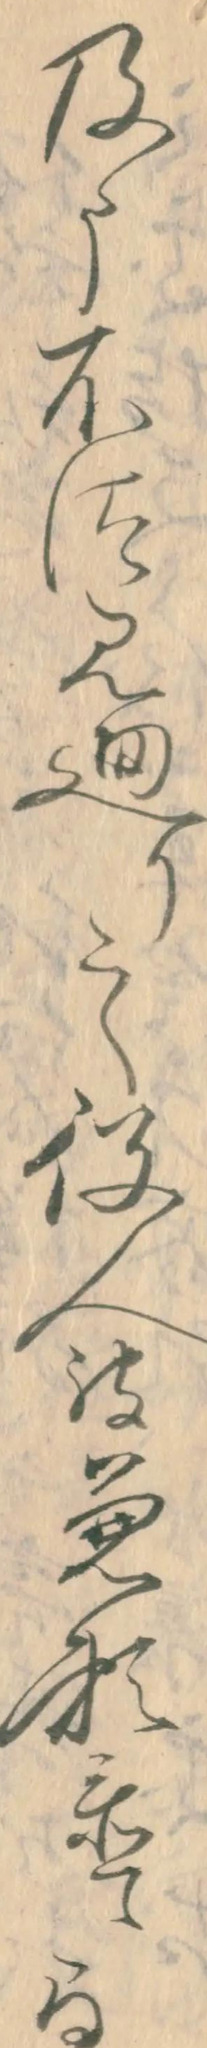及申不法見廻り之役人被兼頼置候間
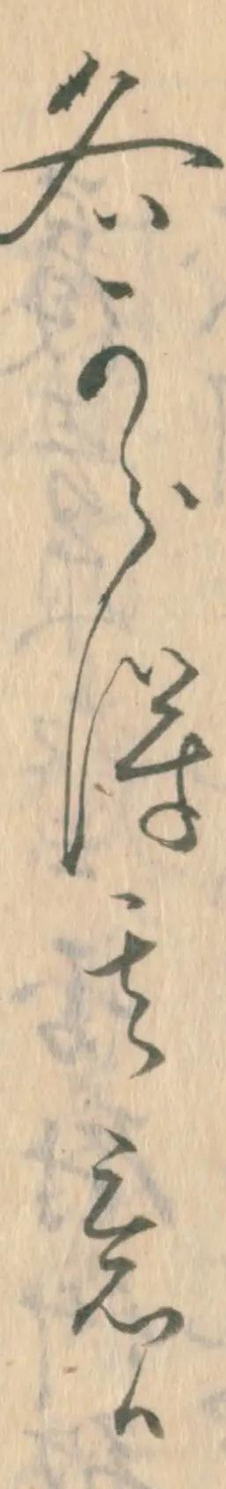各可被得其意候
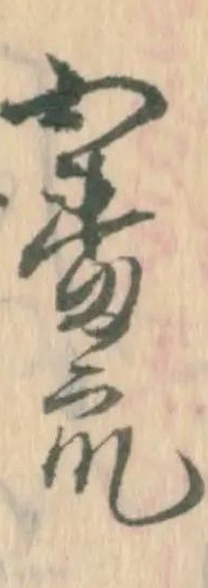五番衆
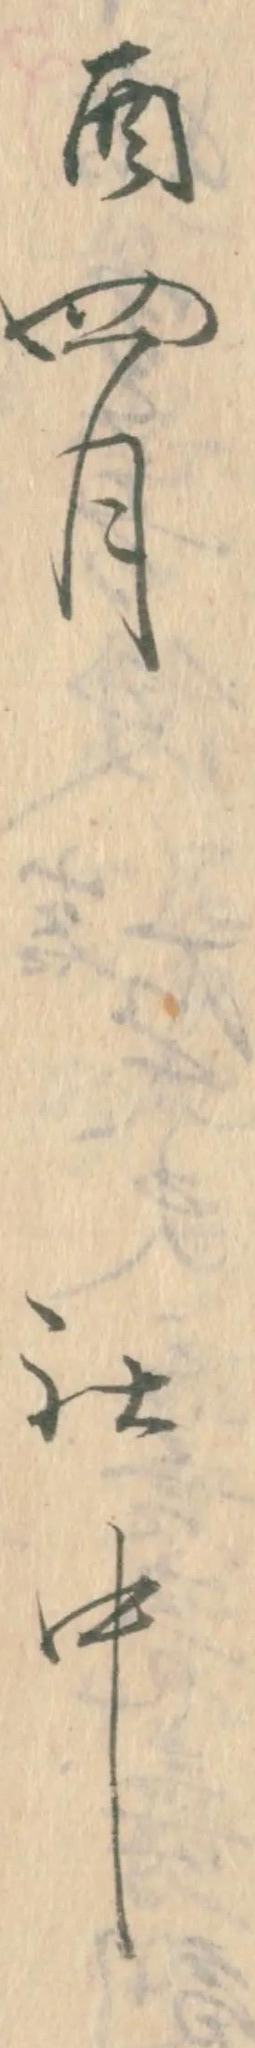酉四月社中
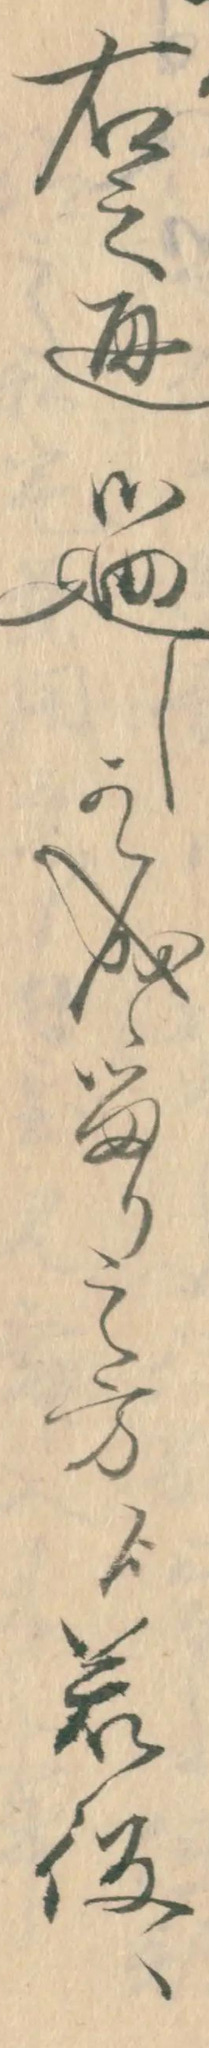右之通御廻り可被成候留り之方ゟ若役へ
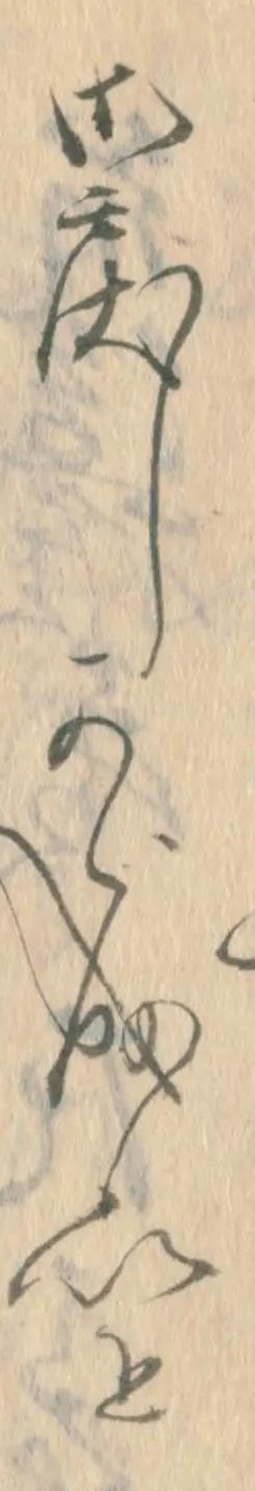御戻し可被成候以上
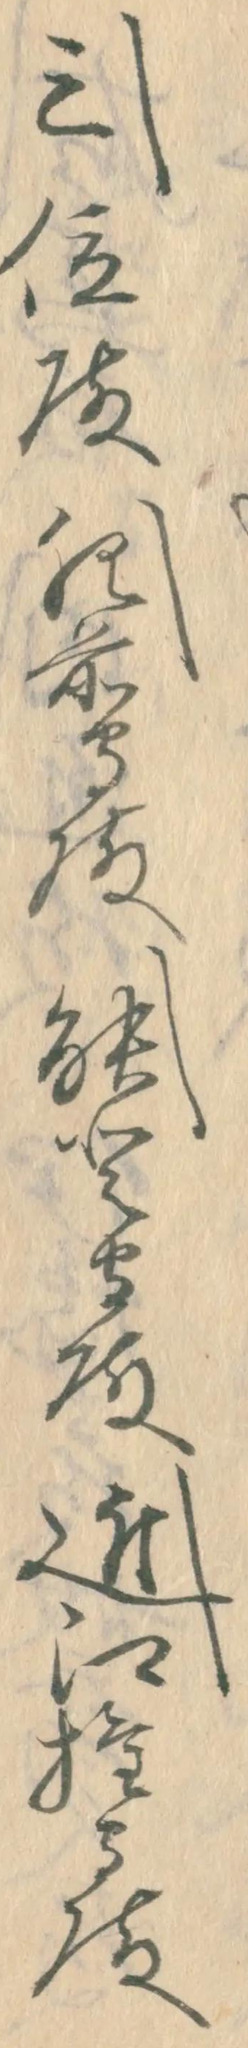弍位殿肥前守殿能登守殿近江権守殿
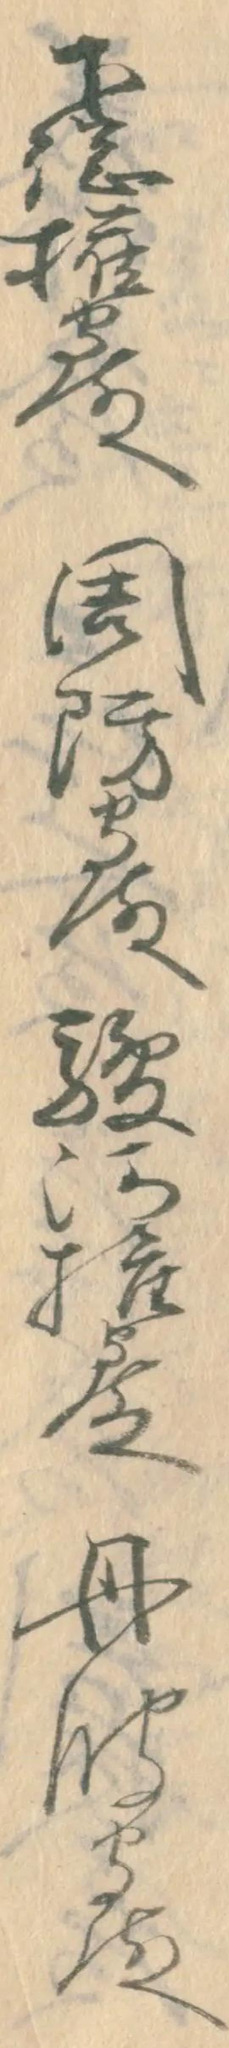下総権守殿周防守殿駿河権守殿丹波守殿

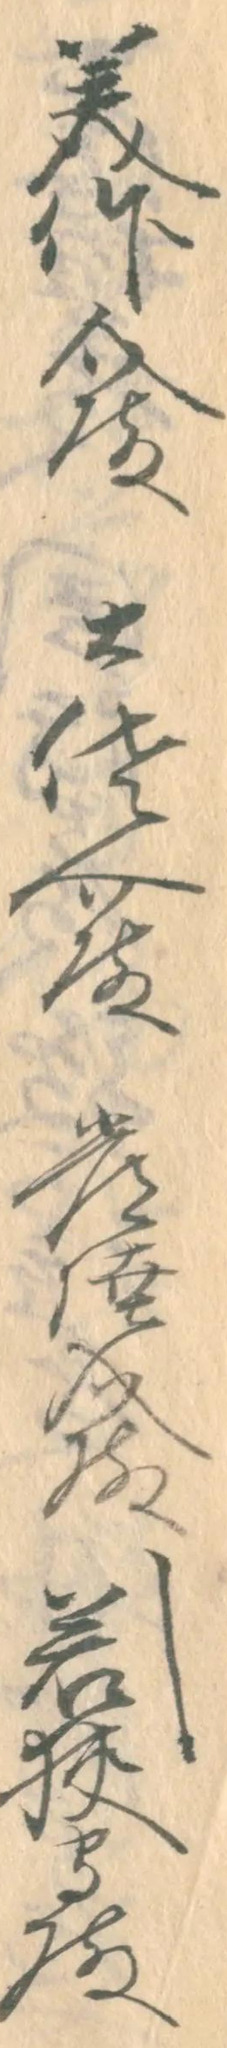美作介殿土佐介殿常陸介殿若狭守殿
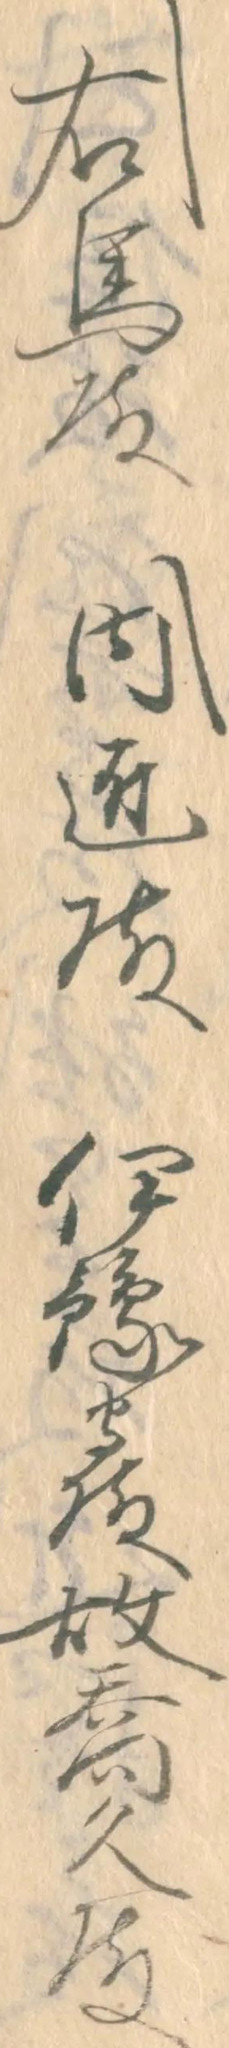右馬殿内匠殿伊予守殿故喬久殿
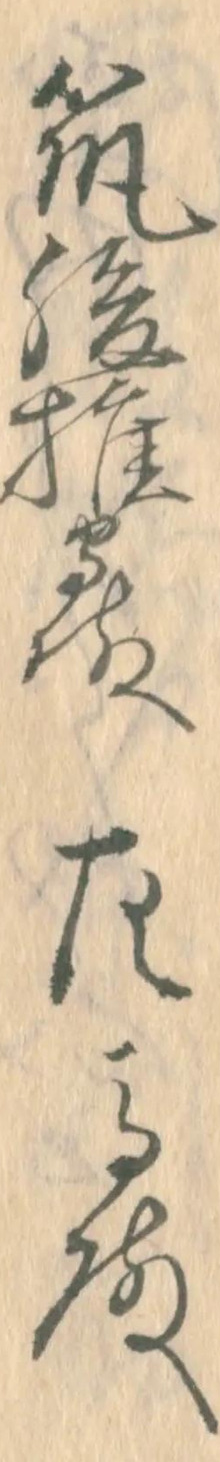筑後権守殿左馬殿
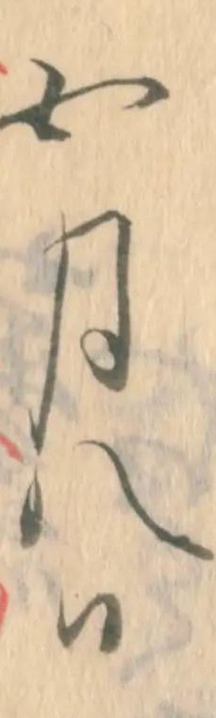五月八日
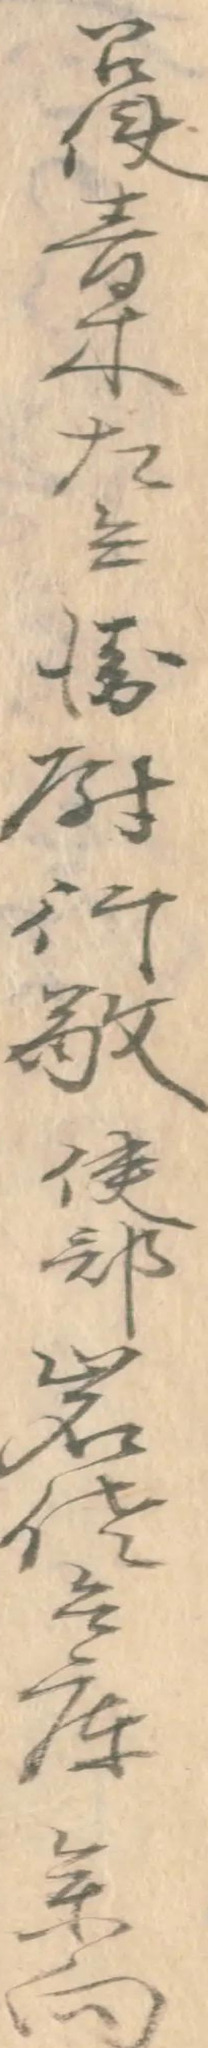召使青木左兵衛尉行敬使部岩佐兵庫参向
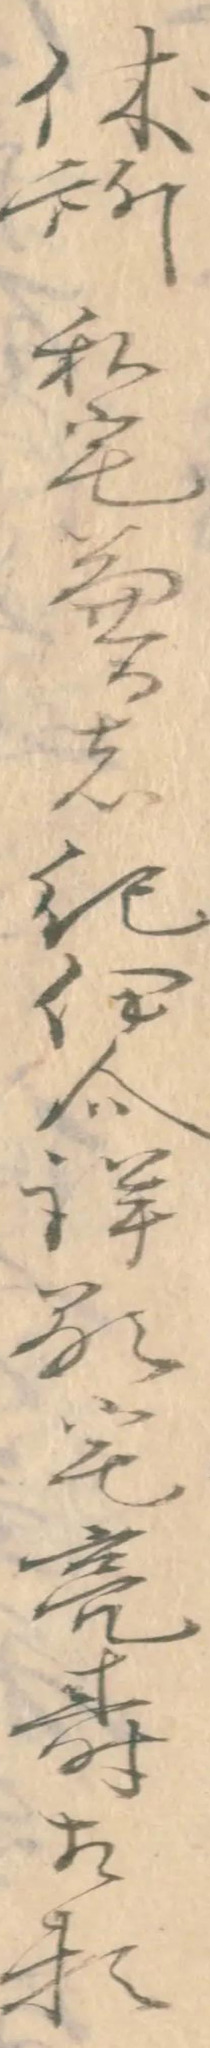休所私宅兼而者紀伊介詳顕宅亮寿相頼
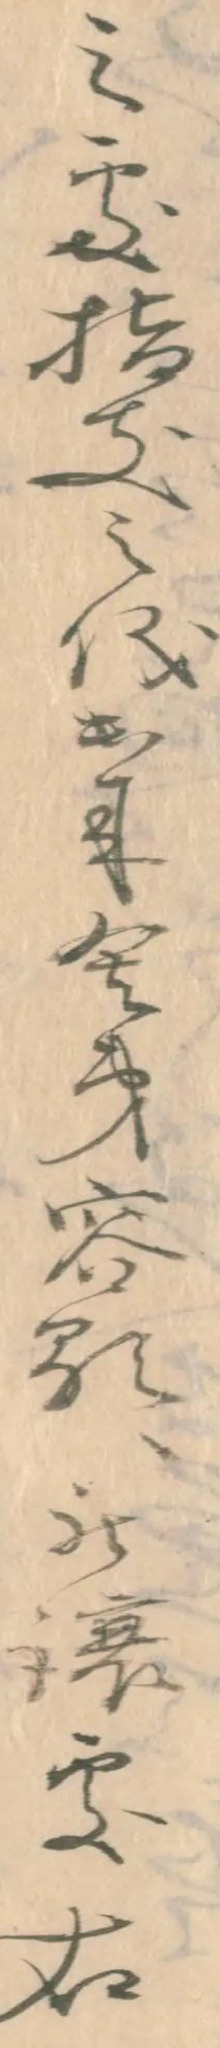之処指支之儀出来舎弟容顕へ被譲処右
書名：賀茂社記録. 第22冊
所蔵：国立国会図書館 National Diet Library, JAPAN
